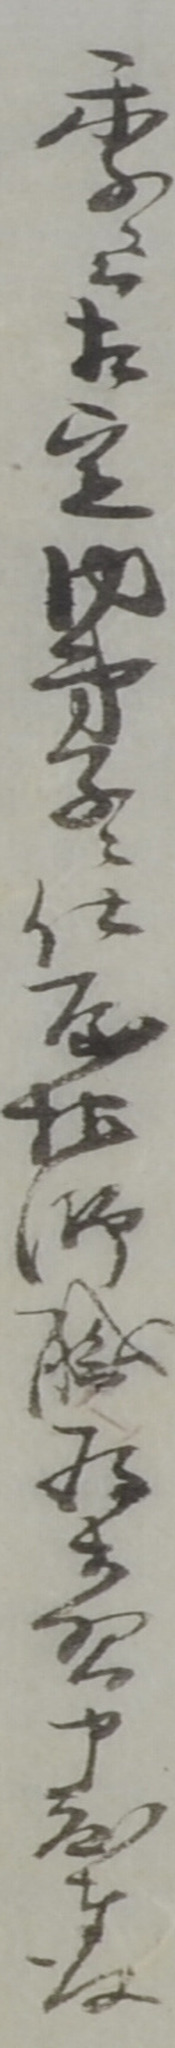季ニ而相定内弟子ニ屋根師職為相習申度奉存
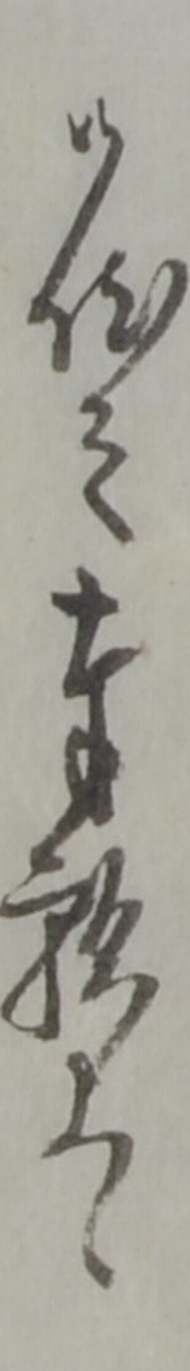候依之奉願上候
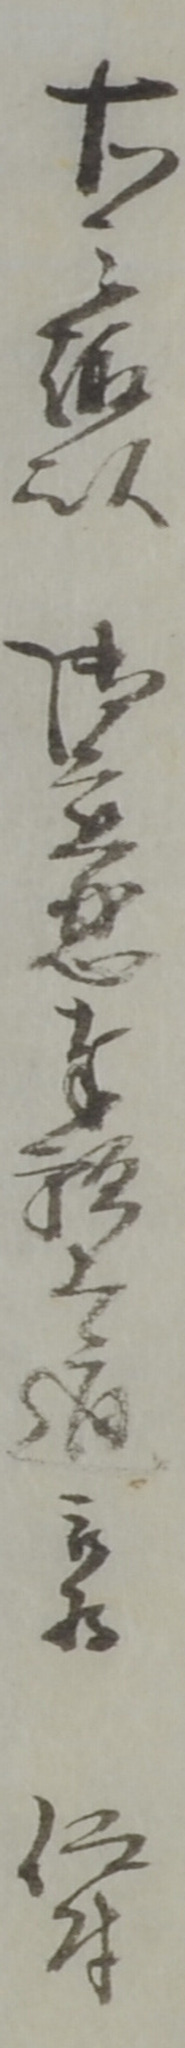右之趣以御慈悲奉願上候通被為仰付
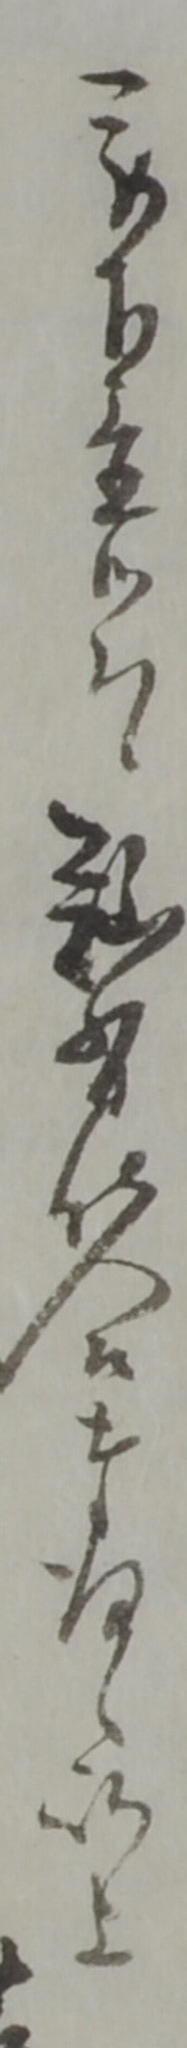被下置候ハヽ難有仕合奉存候以上
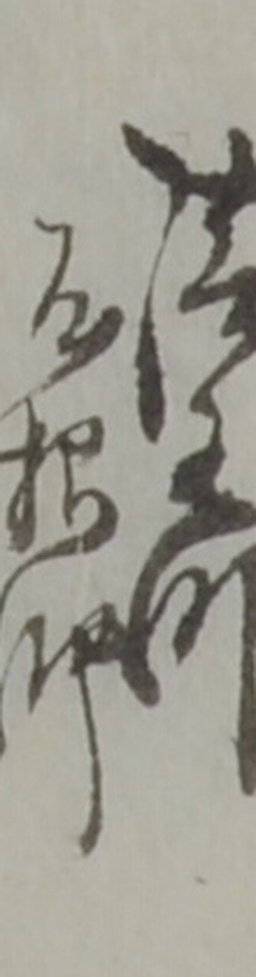屋根師
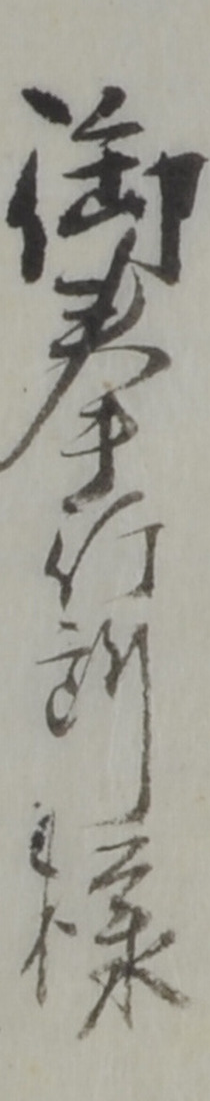御奉行所様
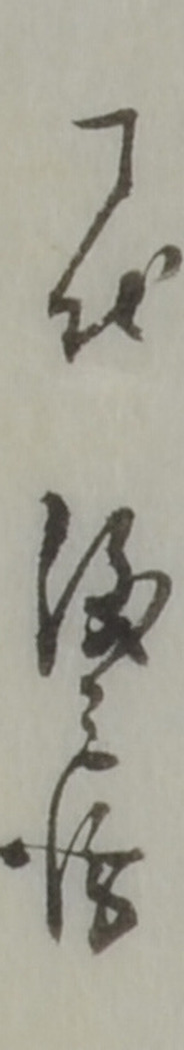丁代儀兵衛
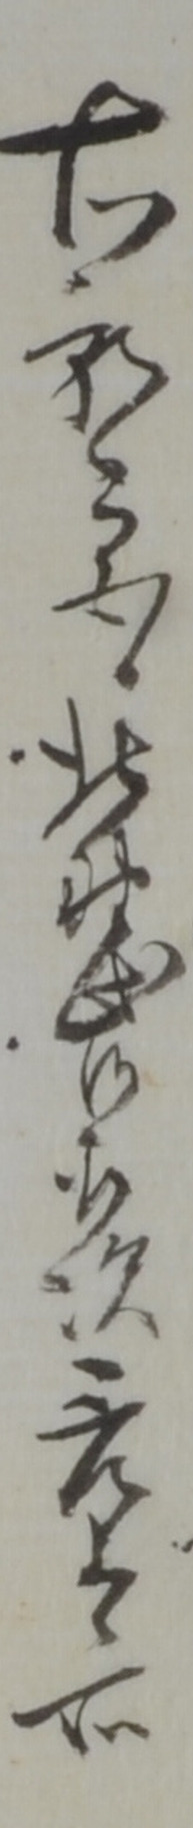右願書五日北野氏御取次差上候所
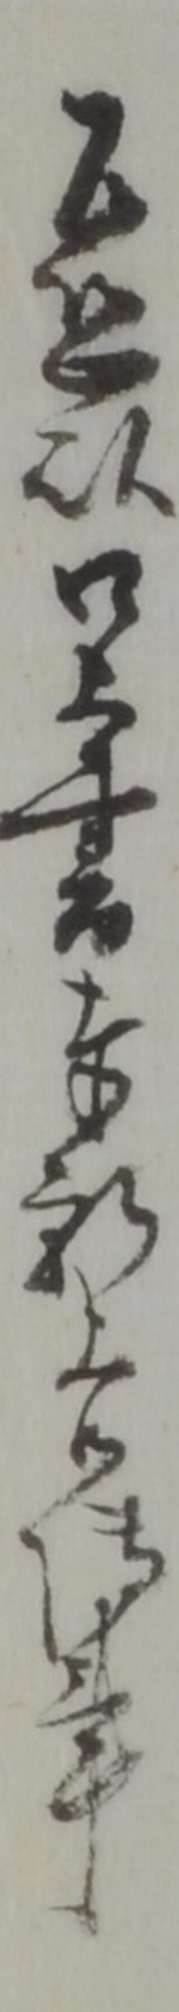乍恐以口上書奉願上候御事
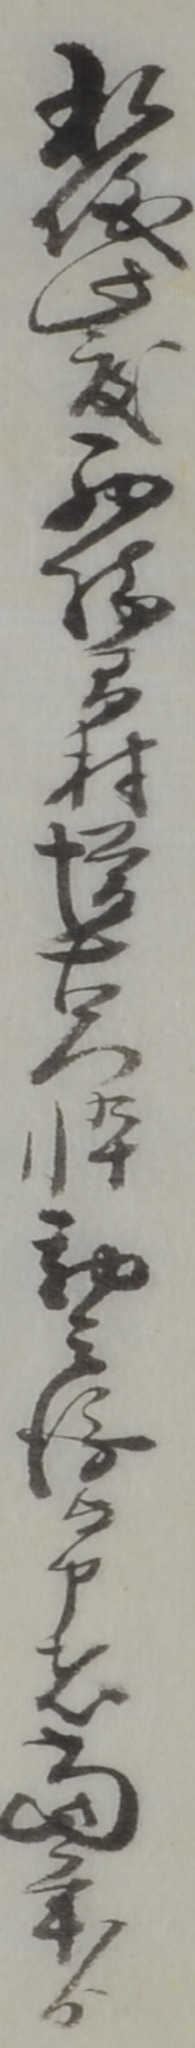私儀此度西勝間村増右衛門忰勘兵衛与申者当年ゟ
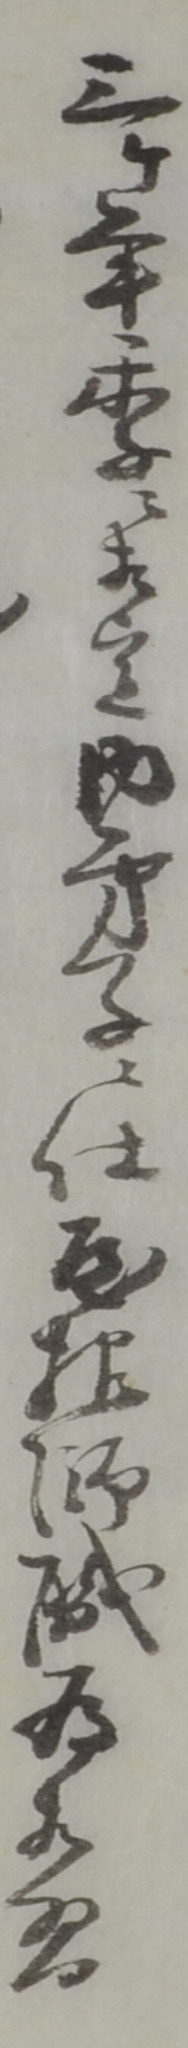三ヶ年季ニ相定内弟子二仕屋根師職為相習
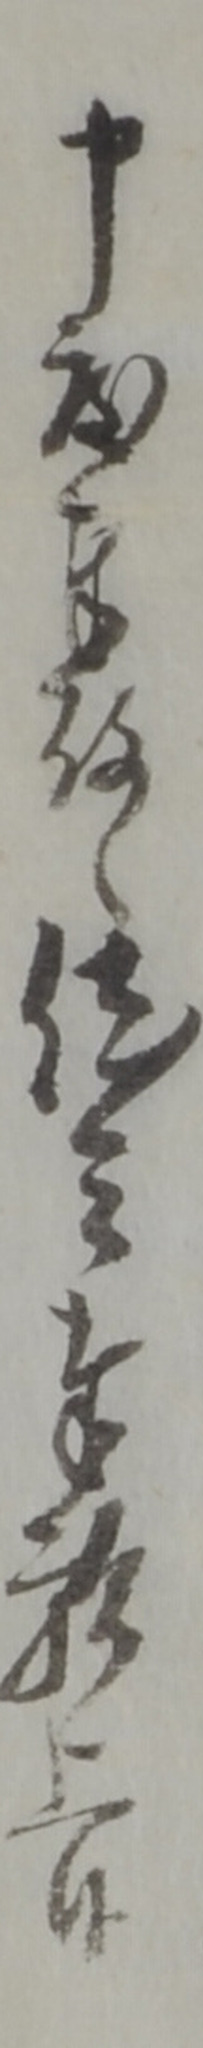申度奉存候依之奉願上候
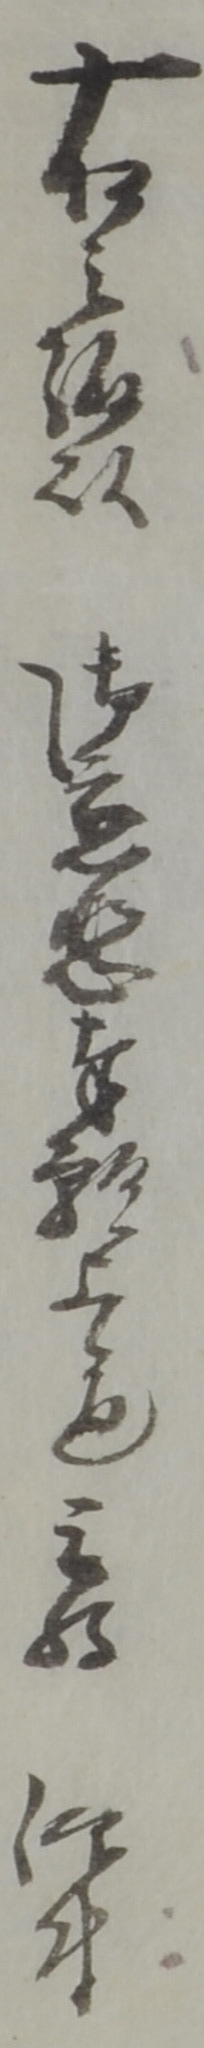右之趣以御慈悲奉願上候通被為仰付
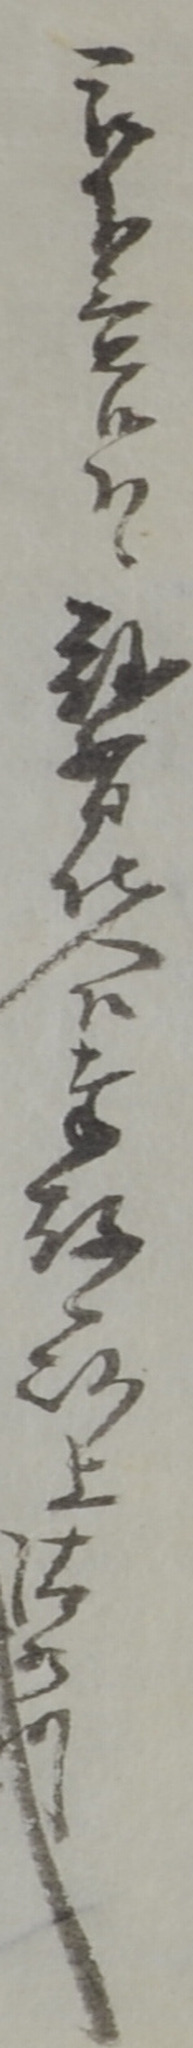被下置候ハヽ難有仕合奉存候以上
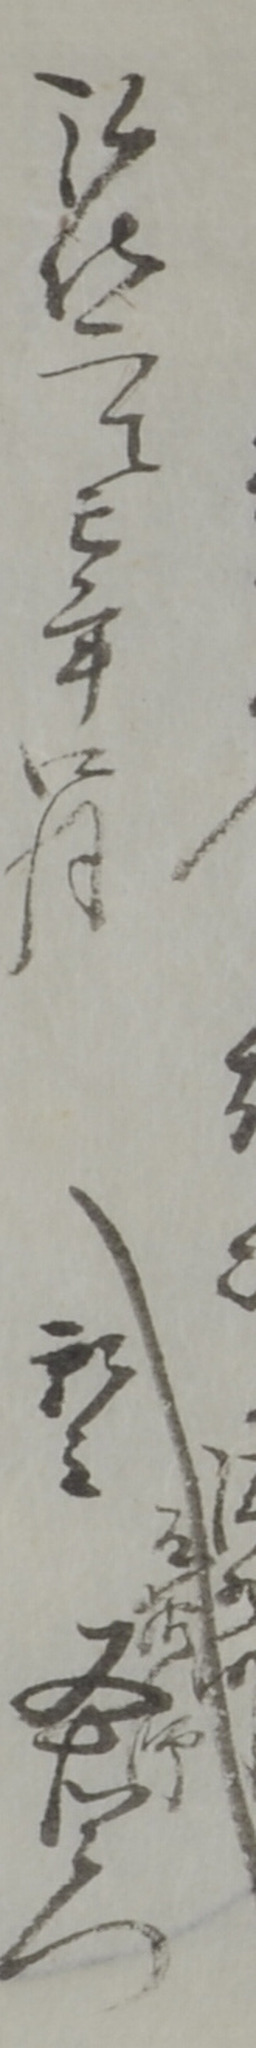弘化二乙巳年四月願主又右衛門
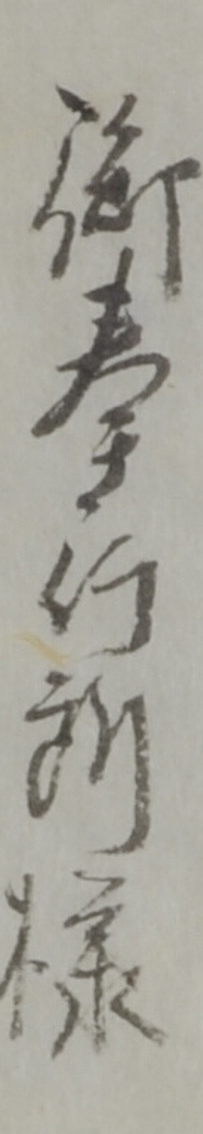御奉行所様
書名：諸願書控簿
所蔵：伊那市立高遠町図書館・合同会社AMANE
